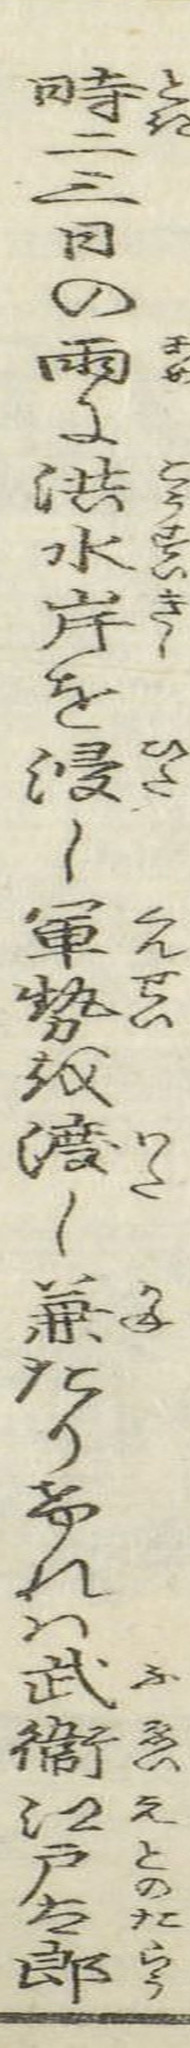時二三日の雨に洪水岸を浸し軍勢を渡し兼たりけれは武衛江戸太郎
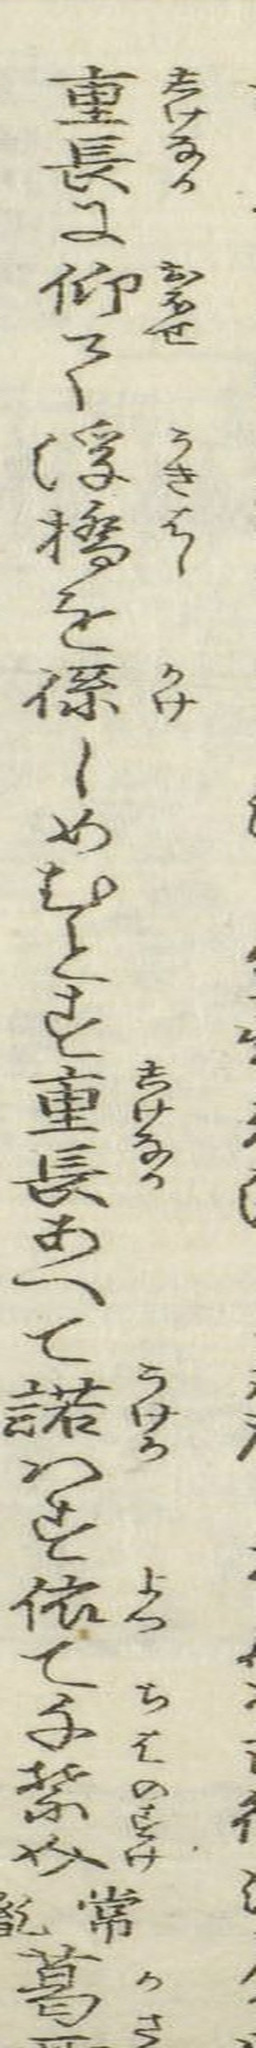重長に仰て浮橋を係しめむとす重長あへて諾はす依て千葉介常胤葛西
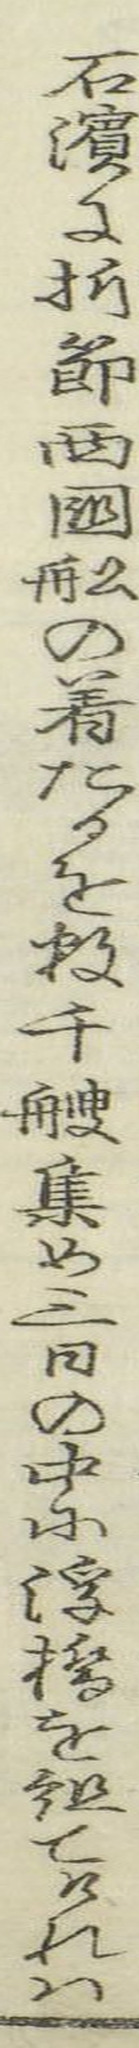石浜に折節西国船の着たるを数千艘集め三日の中に浮橋を組てけれは

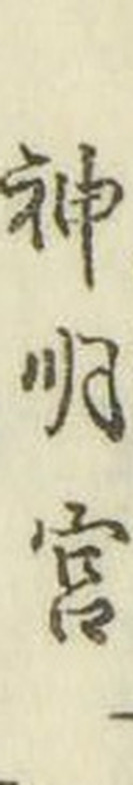神明宮
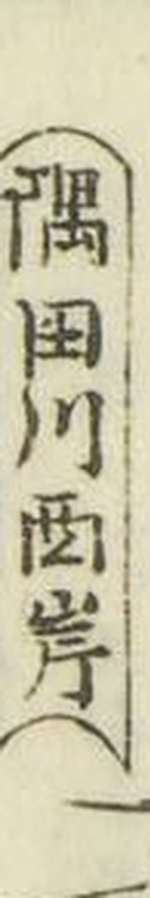隅田川西岸
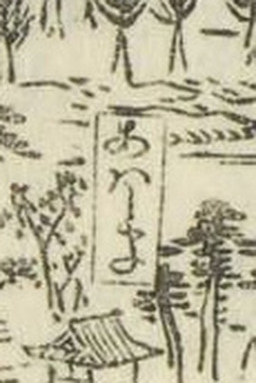あはしま

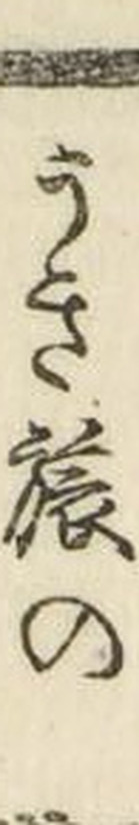うき旅の
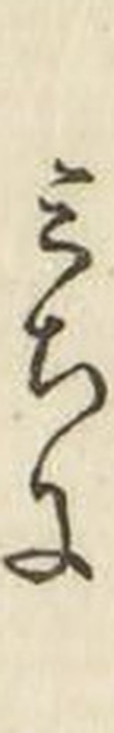みちに
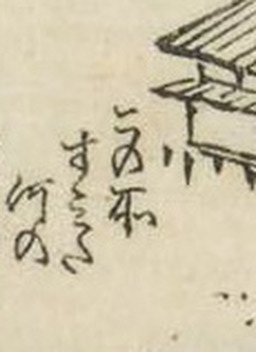この所
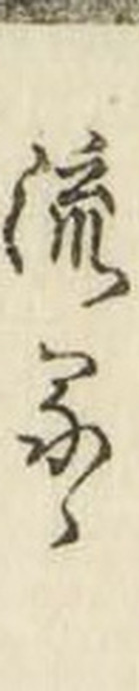流るゝ
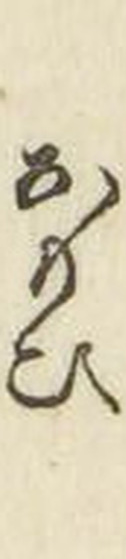おもひ
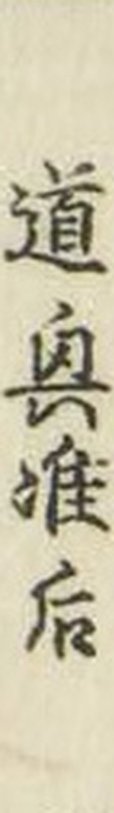道興准后

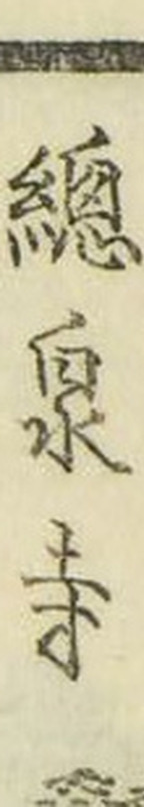総泉寺
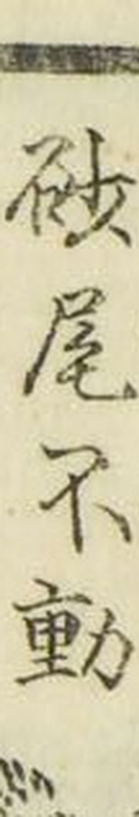砂尾不動
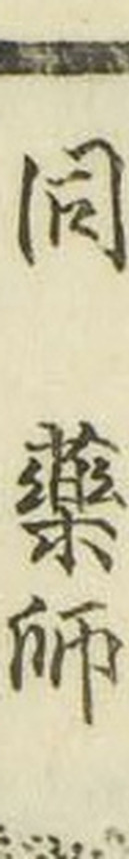同薬師
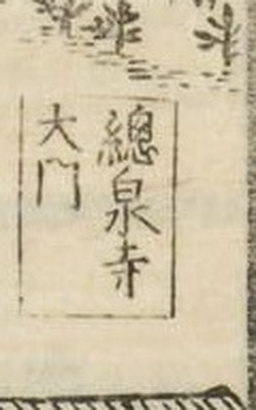総泉寺
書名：江戸名所図会 20巻 巻之17
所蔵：東京学芸大学教育コンテンツアーカイブ
